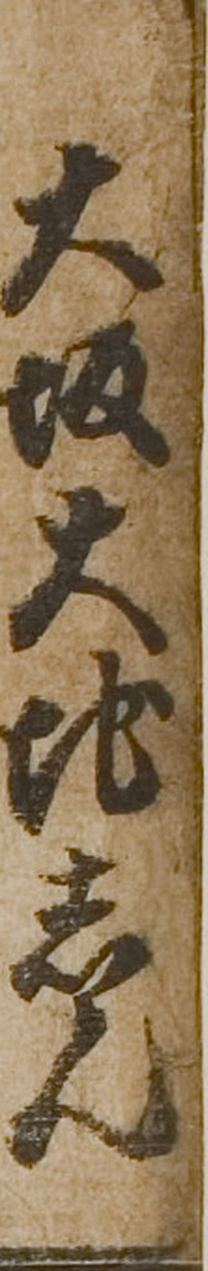大坂大地しん
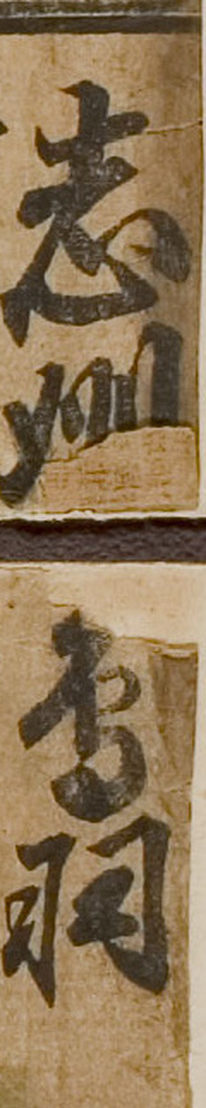志州鳥羽
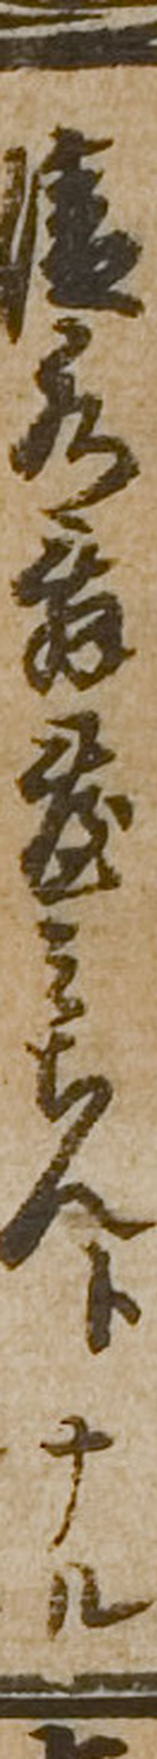清水舞台みちんトナル
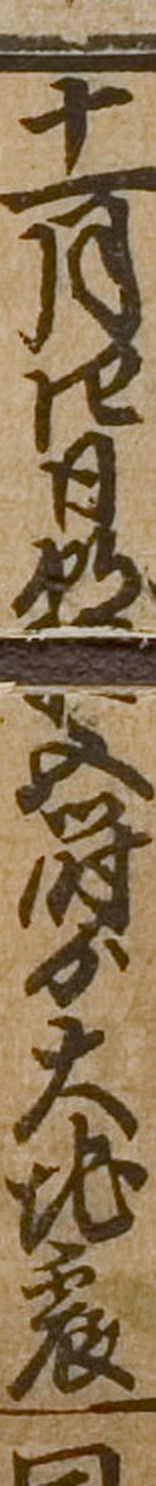十一月四日朝五ツ時ゟ大地震
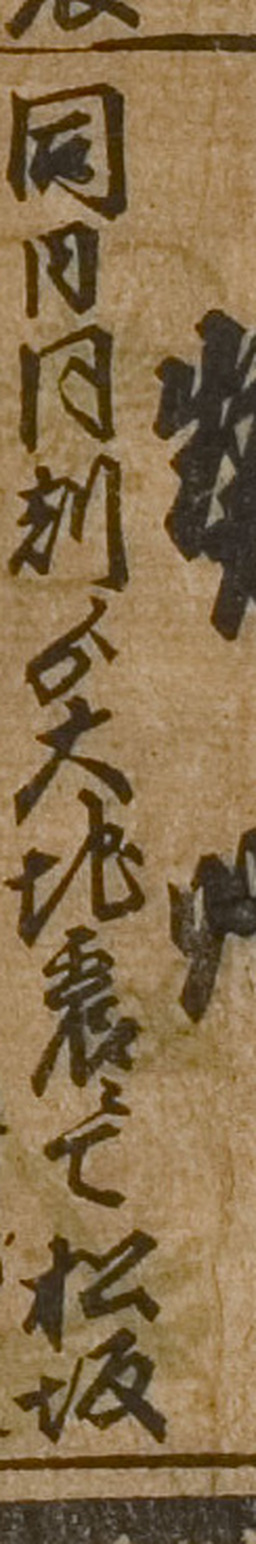同日同刻ゟ大地震二て松坂
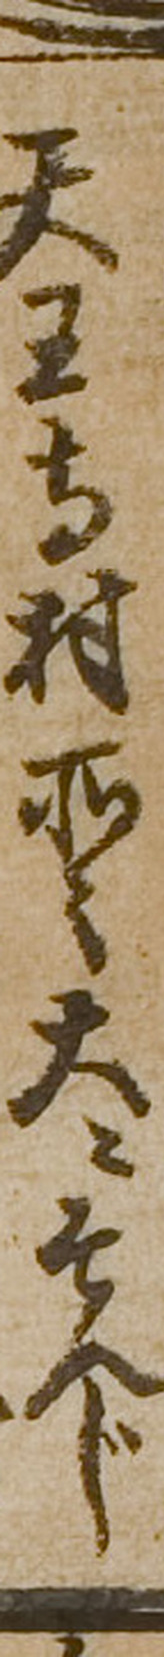天王寺村所々大ニそんじ
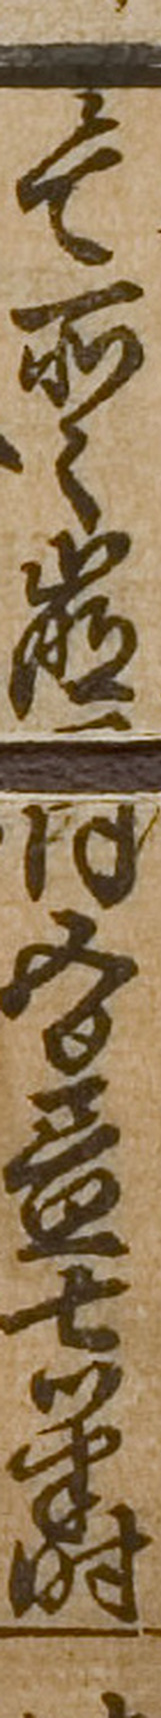にて所々崩同五日昼七ツ半時
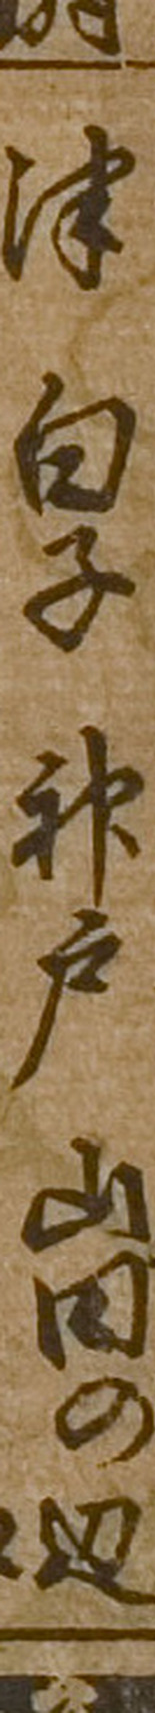津白子神戸山田の辺
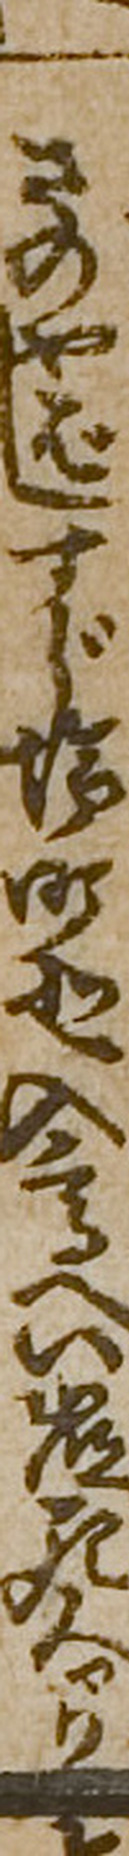さのやばしすじ塩町北へ入高へい崩死人アリ
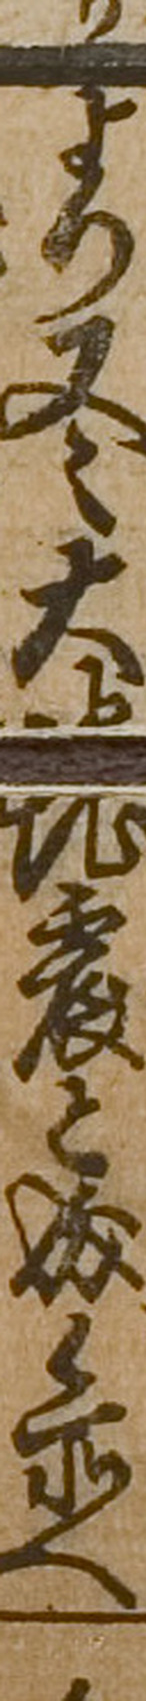より又々大地震と成候所へ
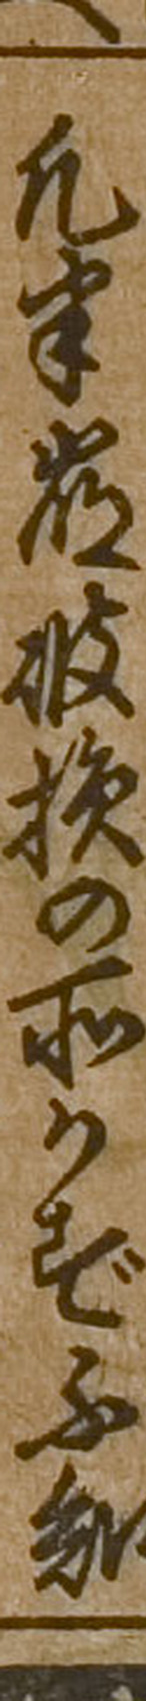凡半崩破損の所かず不知
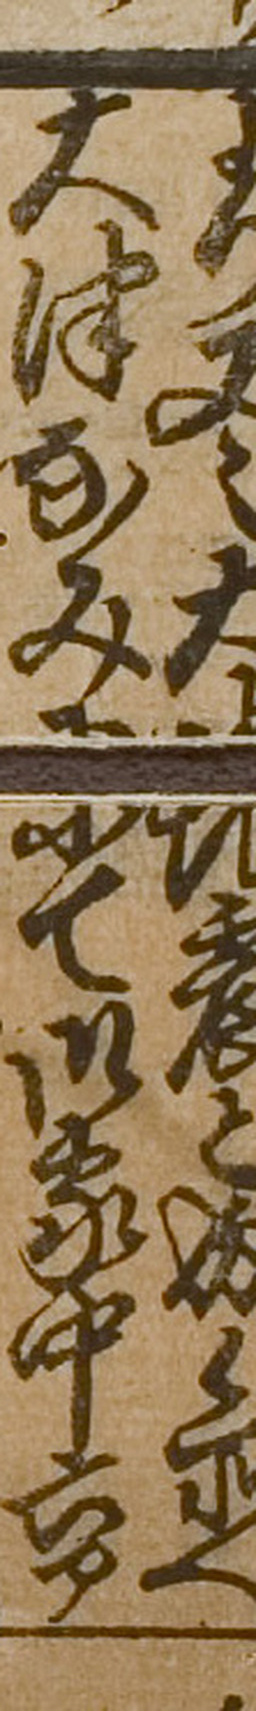大津なみにて御家中六部
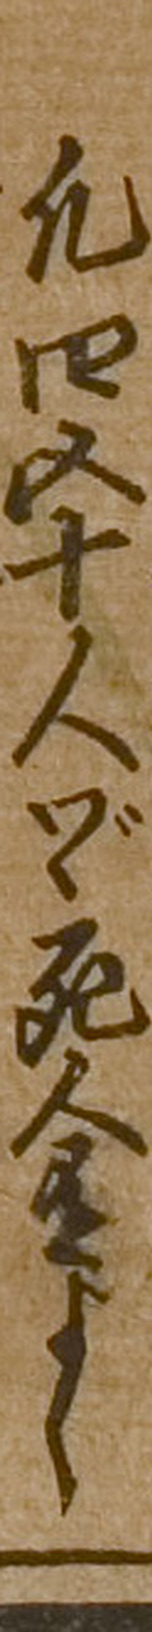凡四五十人ヅゝ死人有よし
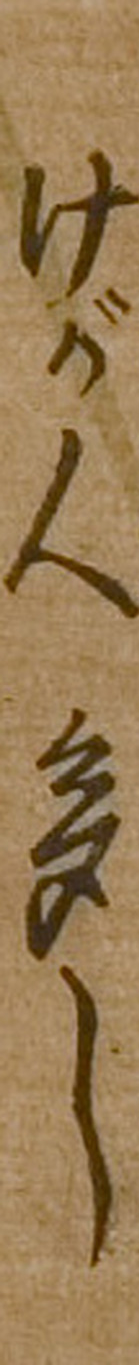けが人多し
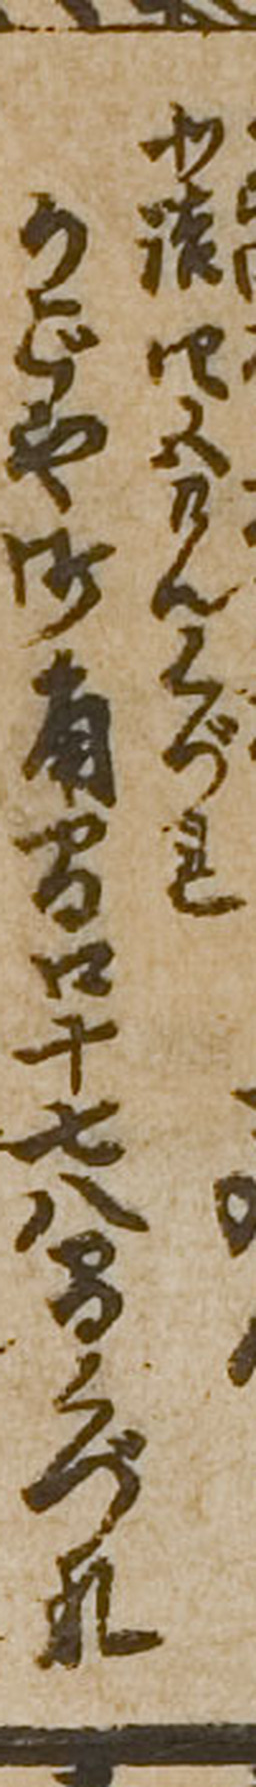かごや町角間口十七八間くづれ
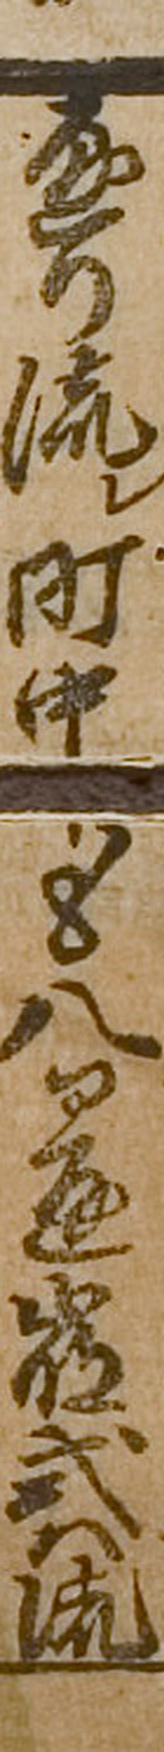通り流レ町中も八部通崩或ハ流
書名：[大坂つなみ]
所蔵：東京大学総合図書館 General Library in the University of Tokyo, JAPAN
